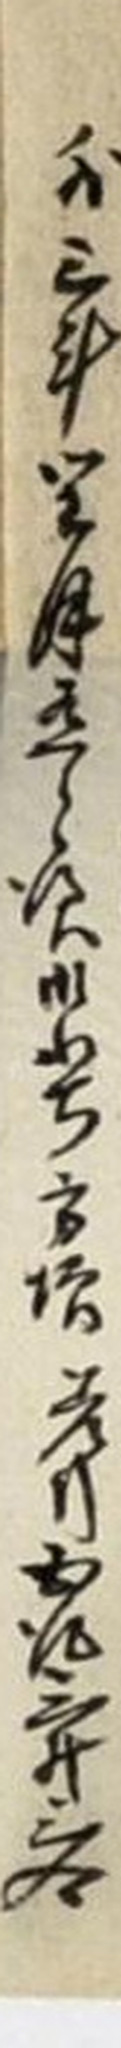外三斗閏月有之候得は御ふち高増差引五俵三升三合

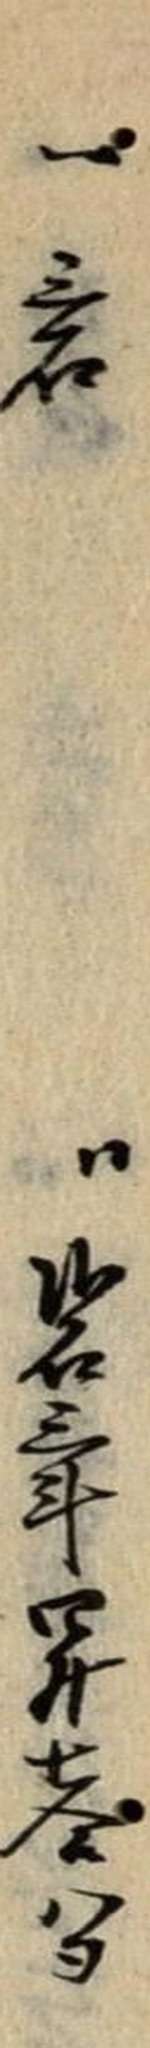一三石同弐石三斗四升七合八勺
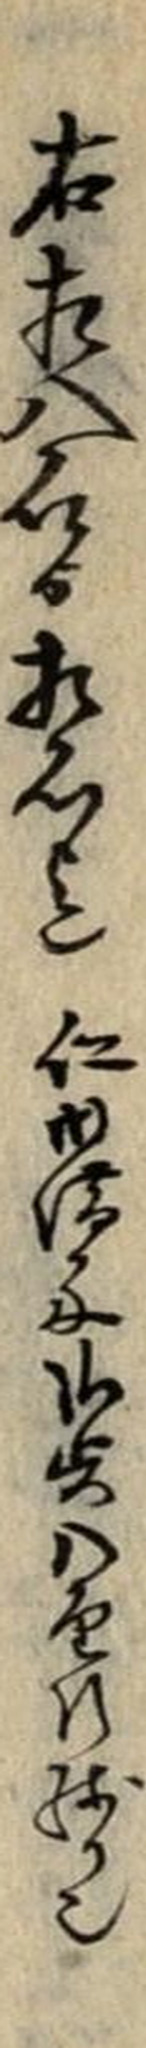右拾八石ゟ拾石迄但御借米弐歩八厘引残り也
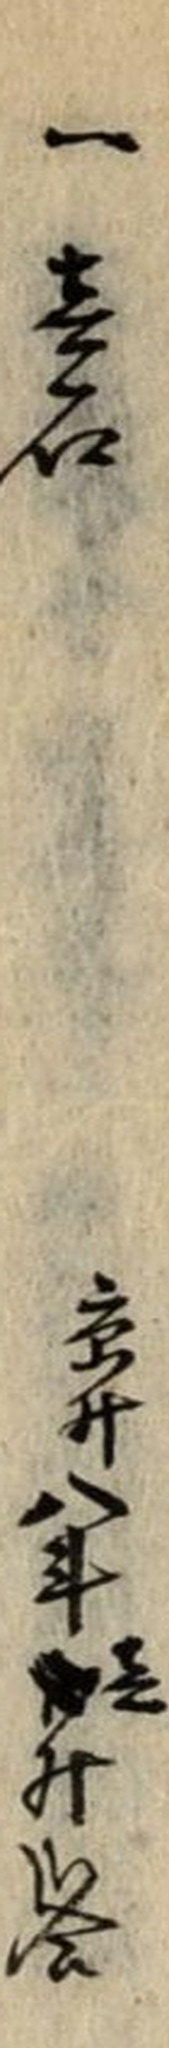一壱石京升八斗壱升弐合
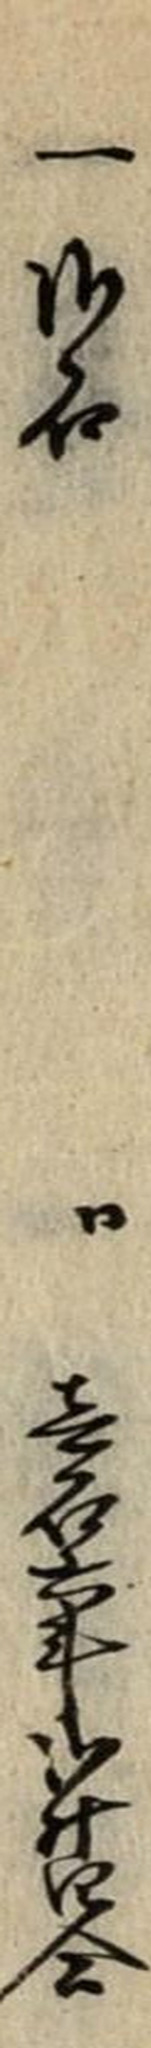一弐石同壱石六斗弐升四合
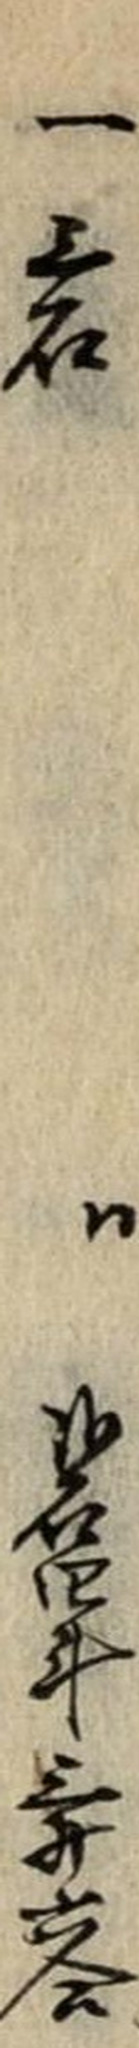一三石同弐石四斗三升六合
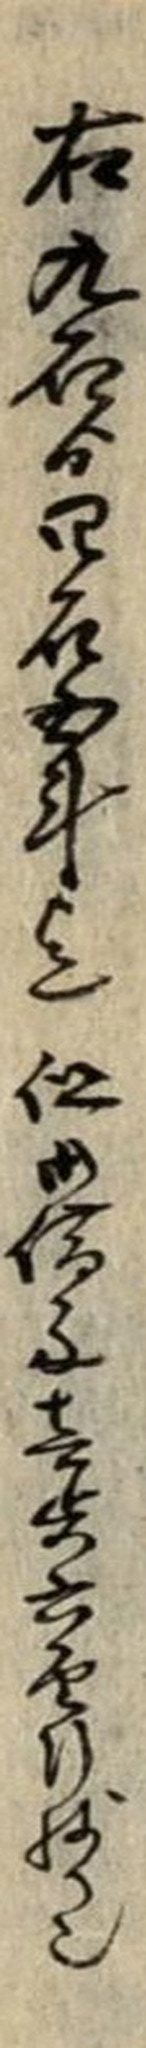右九石ゟ四石五斗迄但御借米壱歩六厘引残り也
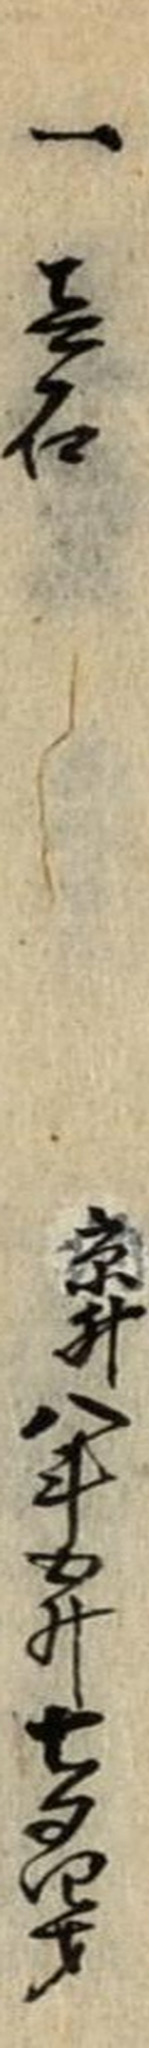一壱石京升八斗五升七勺四才
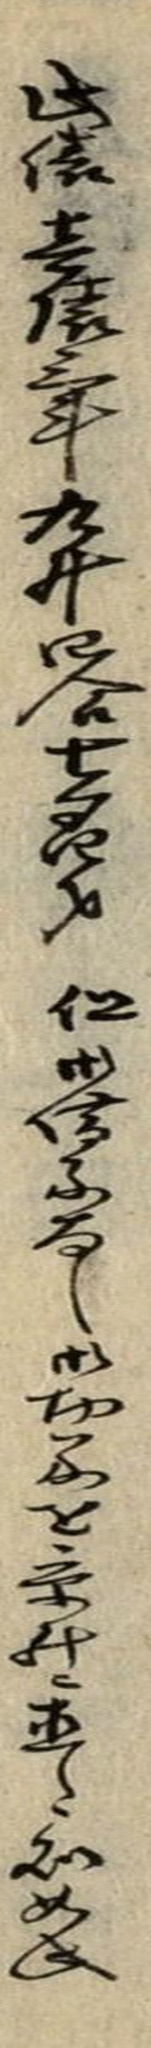此俵壱俵三斗九升四合七勺四才但御借米なし御切米を京升に直し候処如此
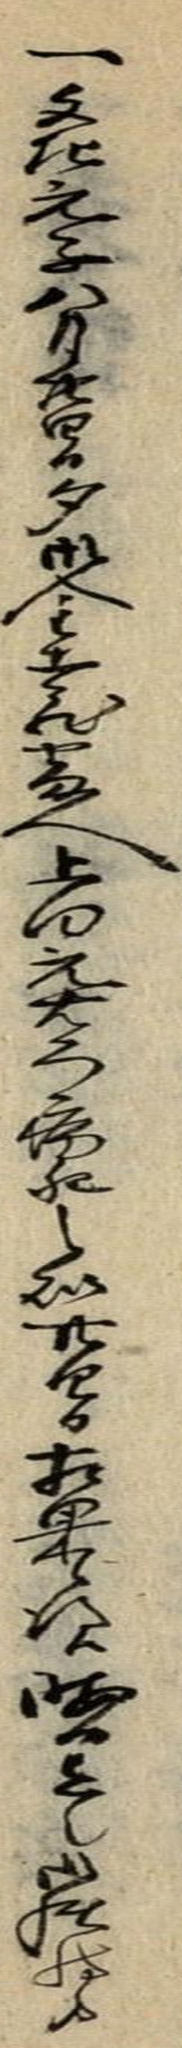一文化元子八月廿四日夕御金土蔵番人上田元右衛門病死之処廿四日相果候得は晦日迄之御扶持方
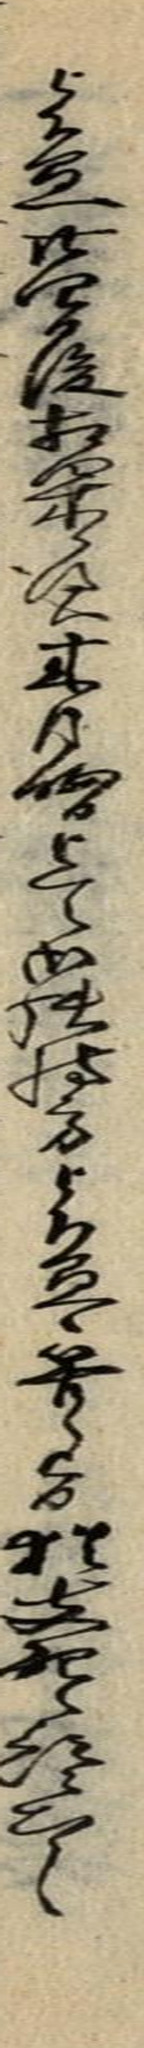被下置廿四日後相果候得は来月晦日迄之御扶持方被下置候筈之旨猶支配之部に出之
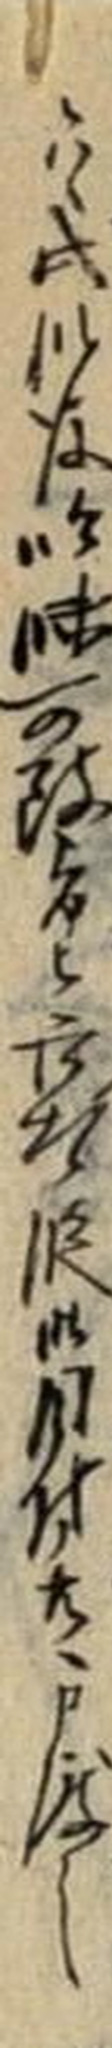候はゝ此以後吟味可致旨被仰出候段御目付共へ申渡之
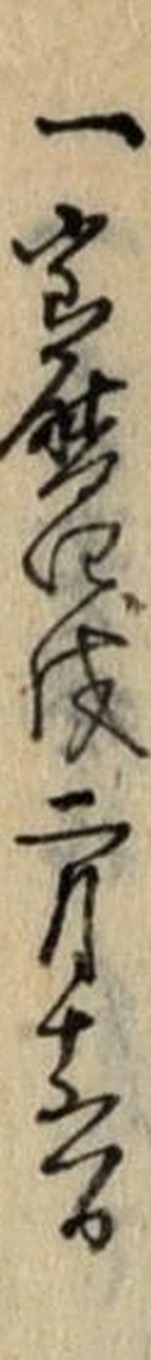一宝暦四戌二月十六日
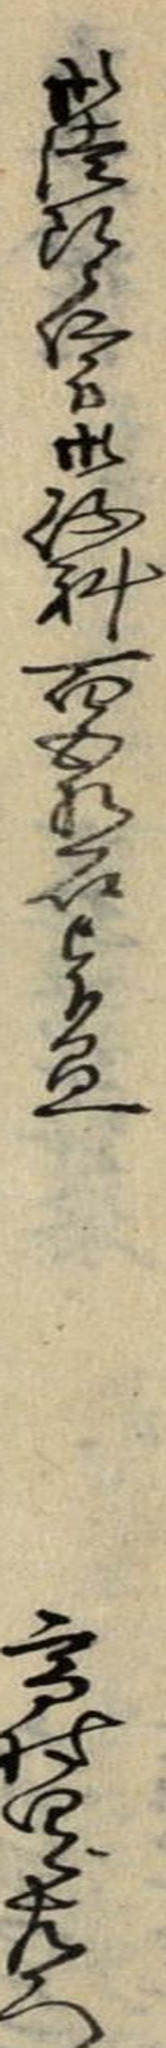御徒頭被仰付御役料百五拾石被下置高村四郎左衛門
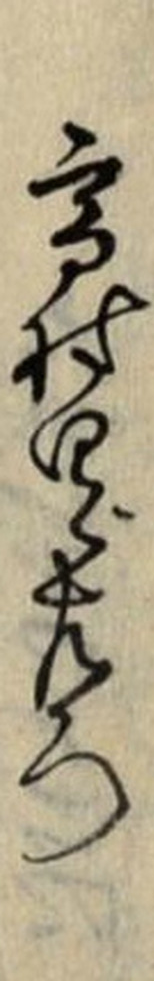高村四郎左衛門
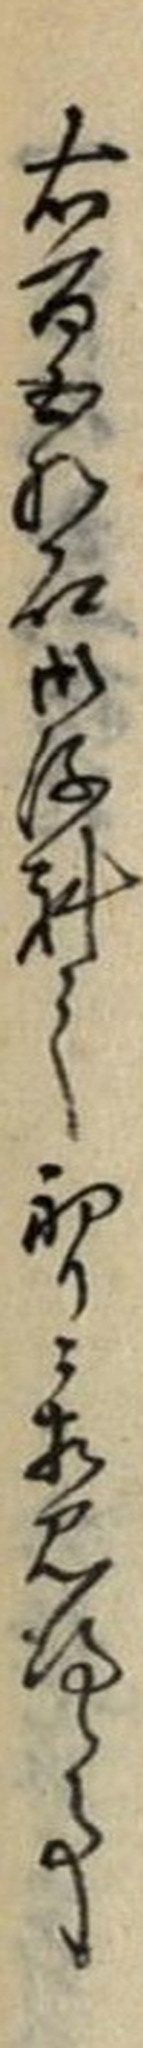右百五拾石御役料之初りに相見得候事
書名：御用并被仰出之部
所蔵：福井県文書館 Fukui Prefectural Archives
